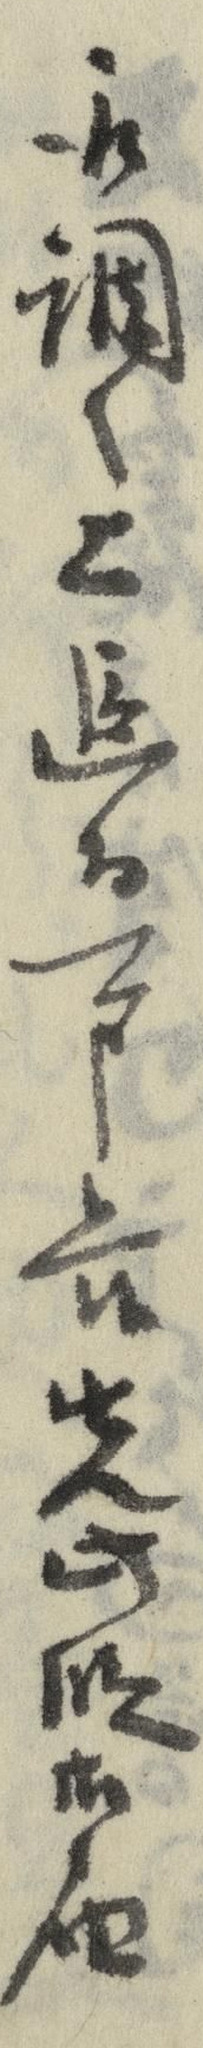取調之上追而可申上候先此段御届
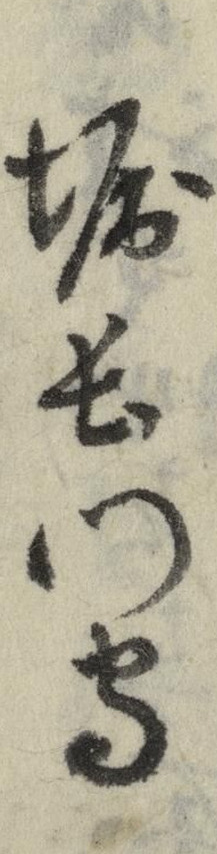堀長門守

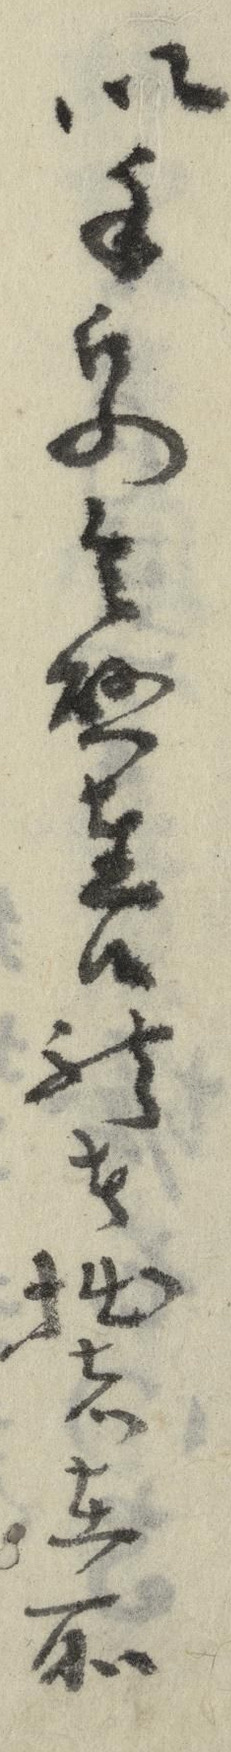以手文奉啓達候然者拙者在所
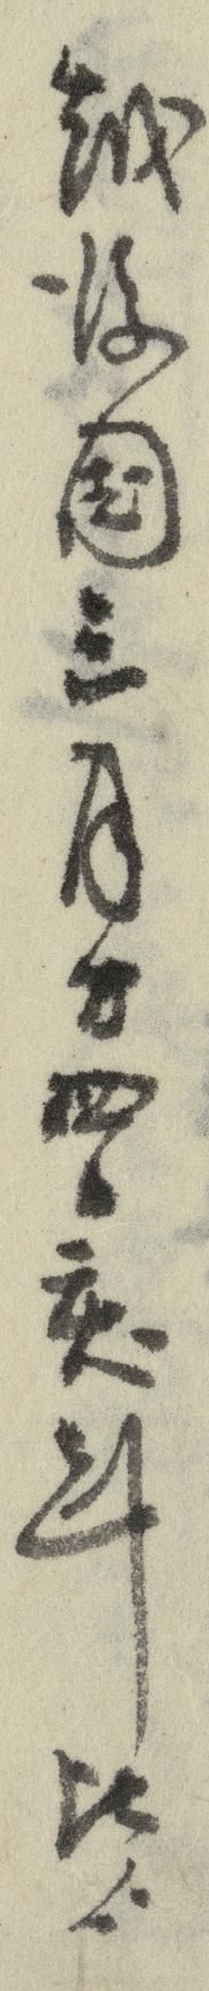越後国三月廿四日亥刻比ゟ
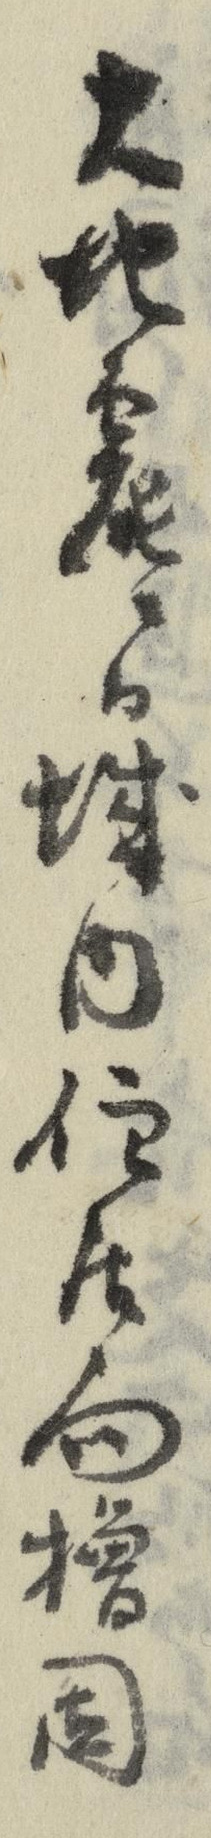大地震二而城内住居向櫓囲
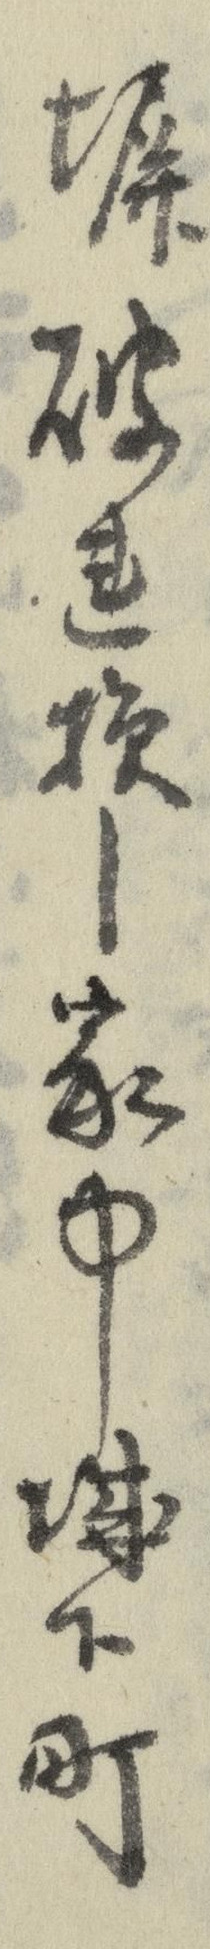塀破れ損し家中城下町
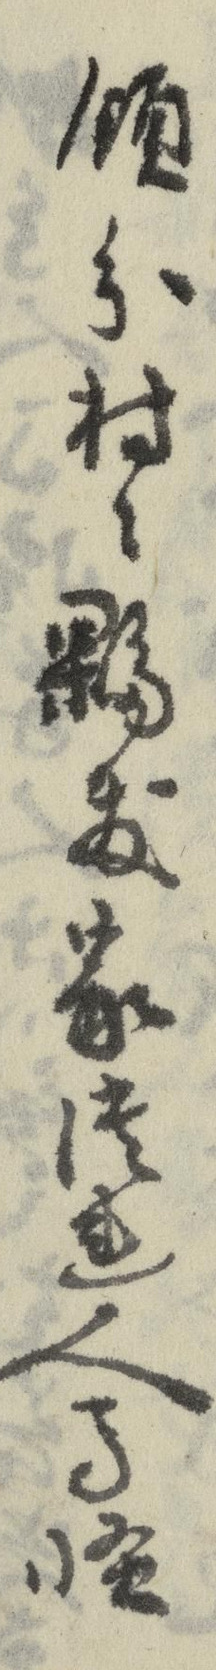同断領分村々夥敷家潰れ人馬怪
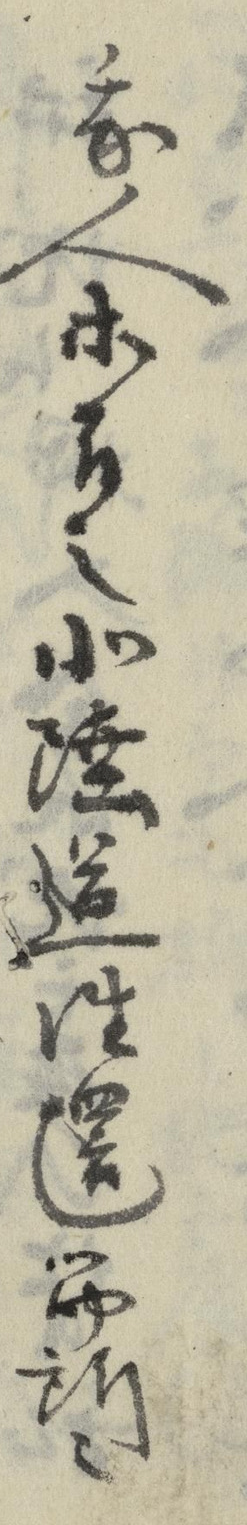我人等有之北陸道往還筋所々
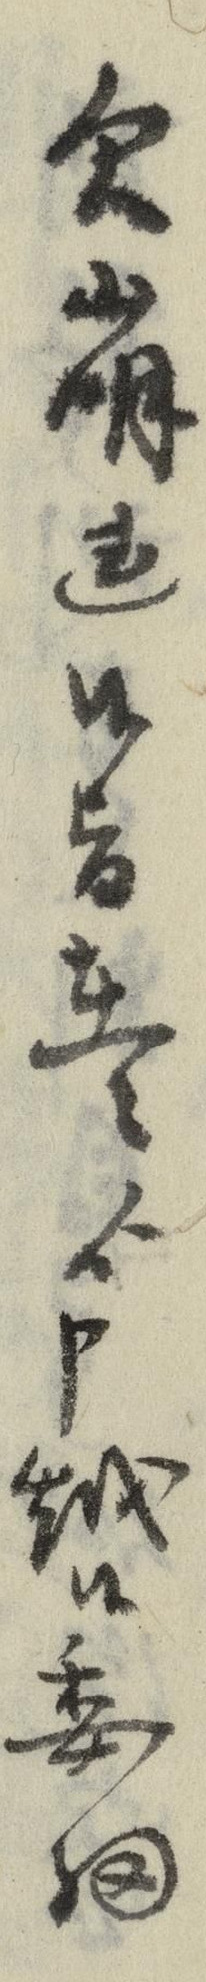欠崩れ候旨在々ゟ申越候委細
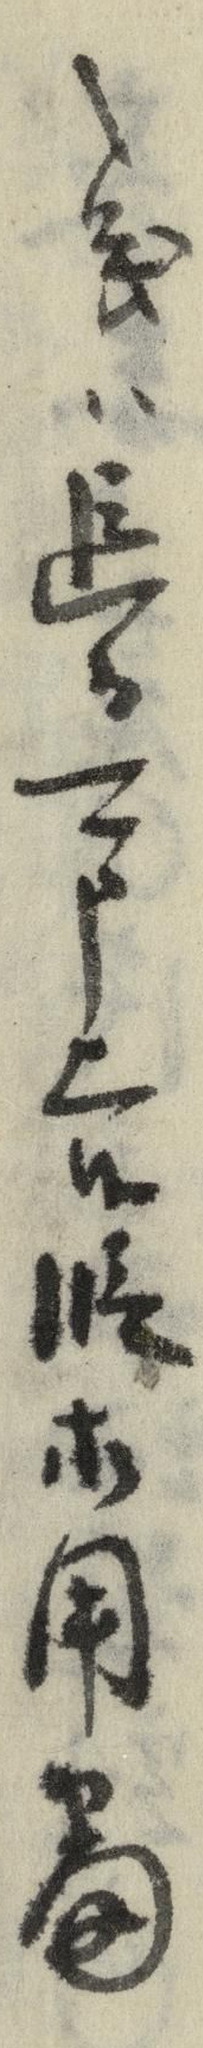之義ハ追而可申上候段御用番
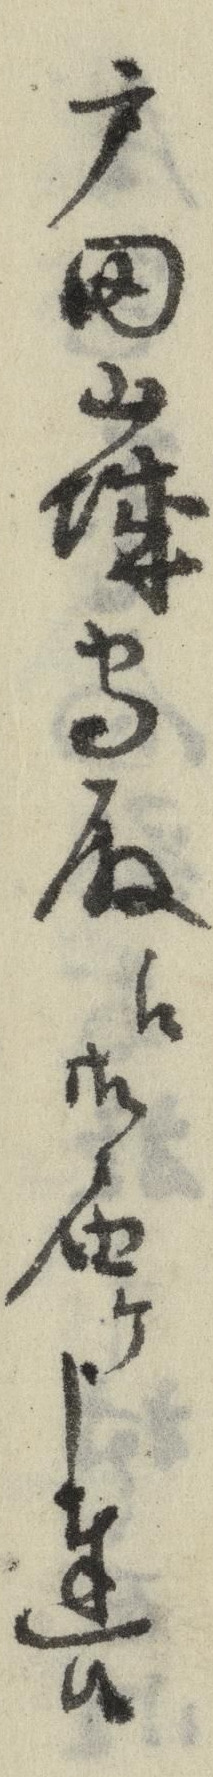戸田山城守殿江御届ヶ申達候
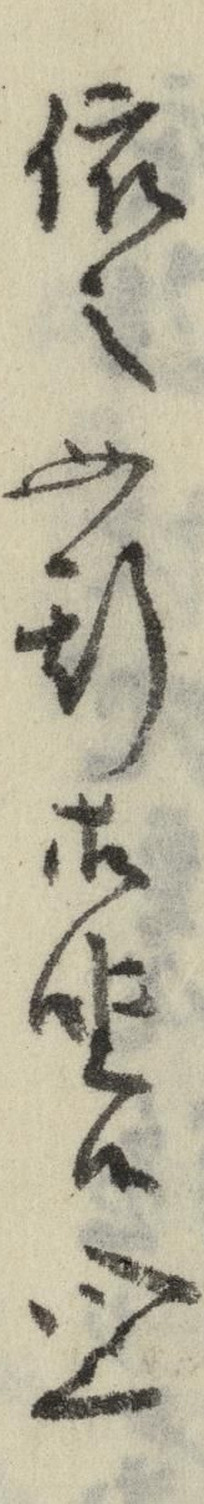依之如斯御坐候以上
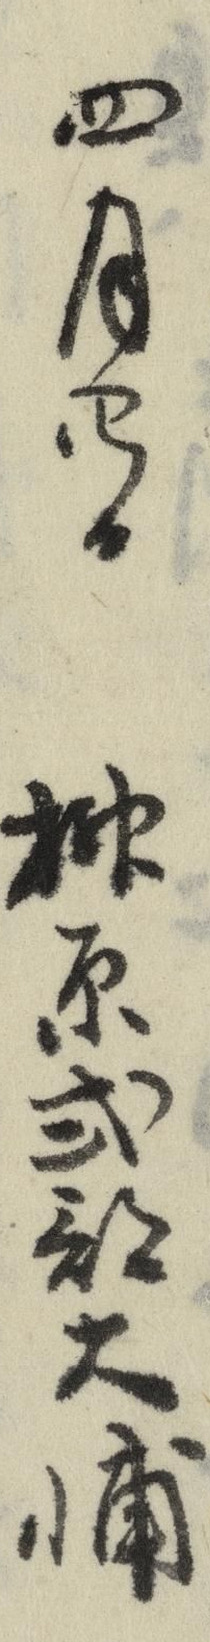四月四日榊原式部大輔
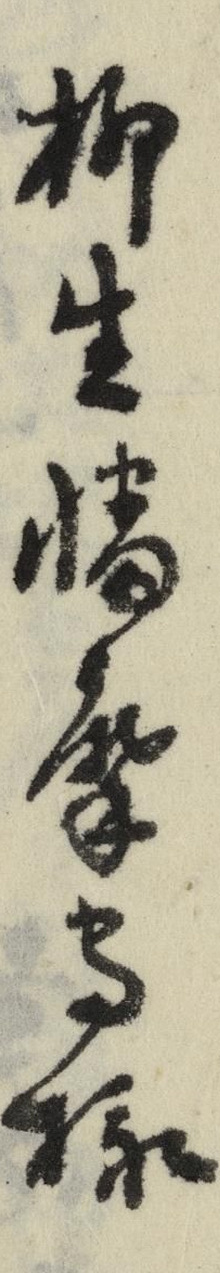柳生播磨守様
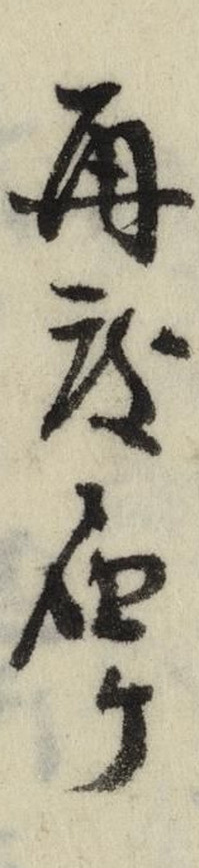再度届ヶ
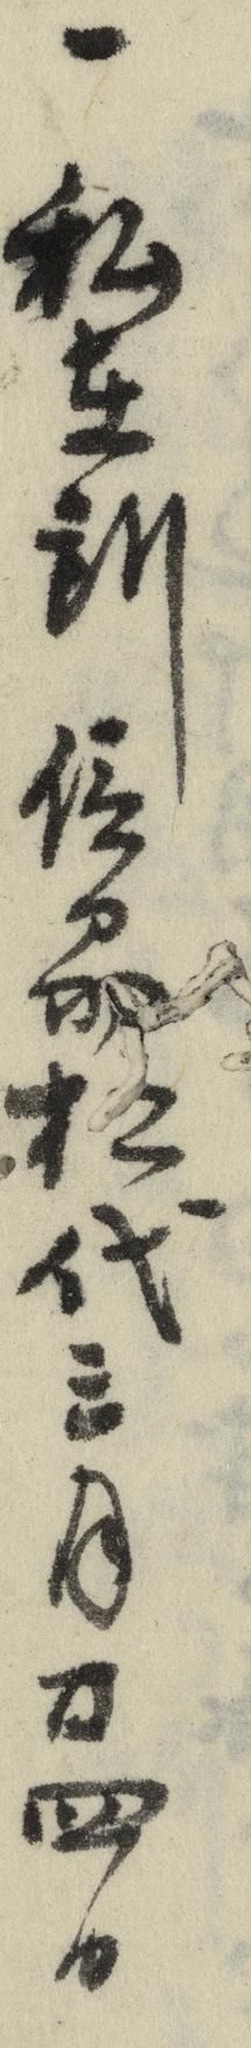私在所信州松代三月廿四日
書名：信州大地震一件之冩　丁未弘化四年三月吉日
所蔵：東京大学地震研究所図書室 Earthquake Research Institute Library, The University of Tokyo, JAPAN
